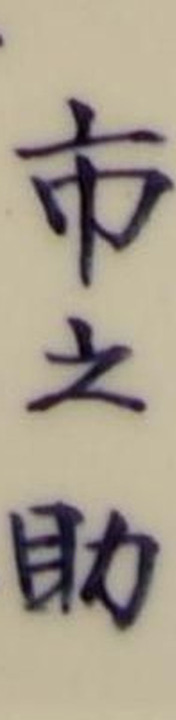市之助
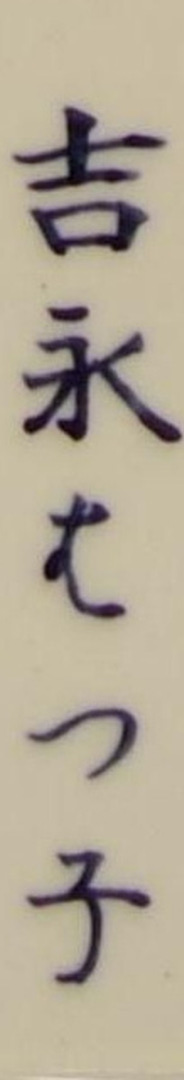吉永はつ子
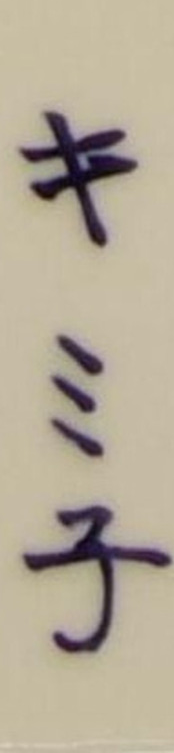キミ子
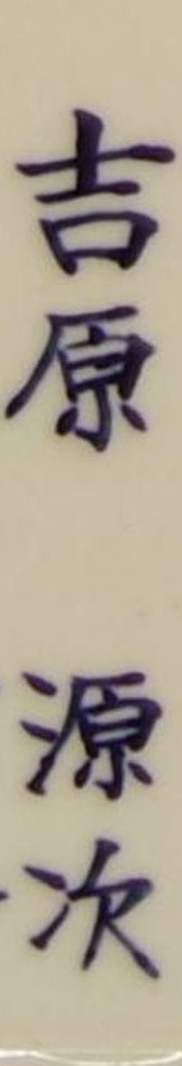吉原源次
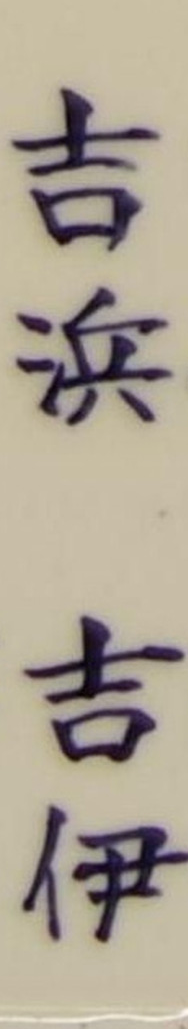吉兵吉伊
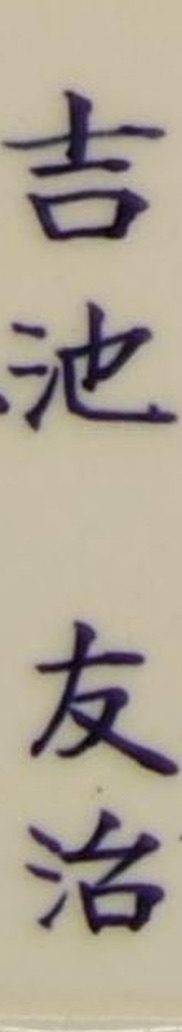吉池友治
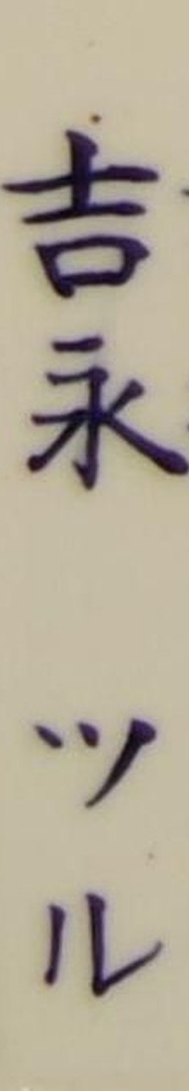吉永ツル

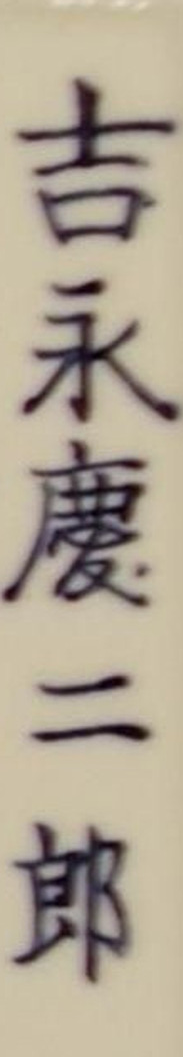吉永慶二郎
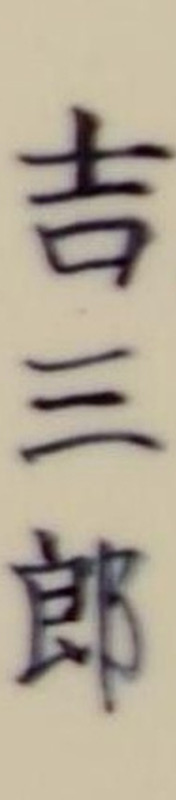吉三郎
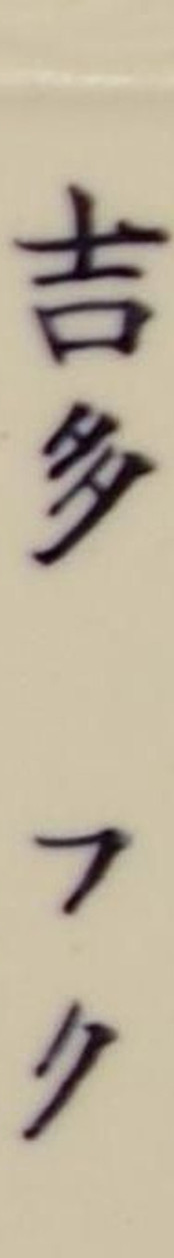吉多フク
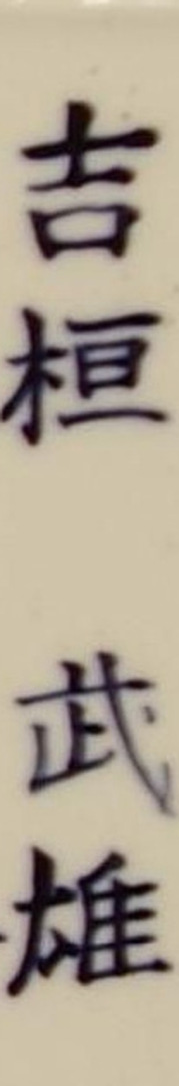吉桓武雄
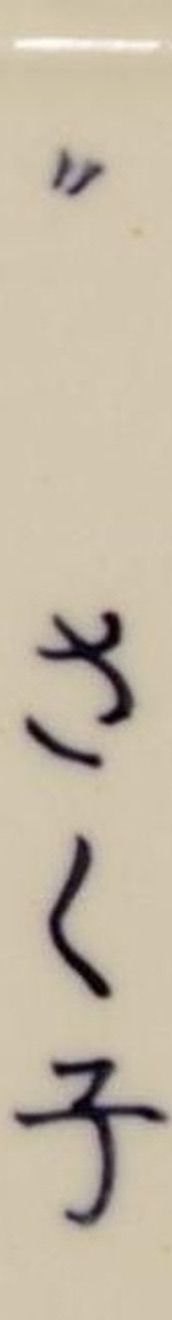さく子
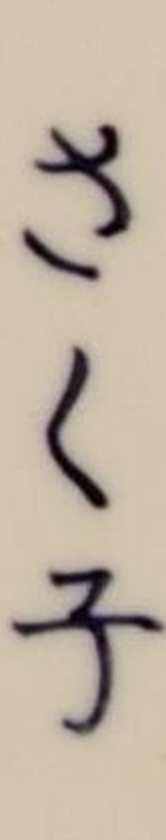さく子
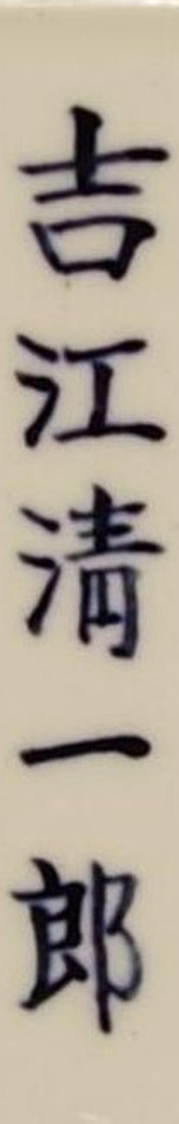吉江清一郎
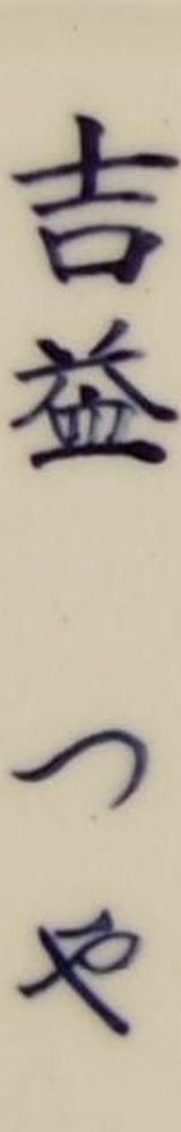吉益つや
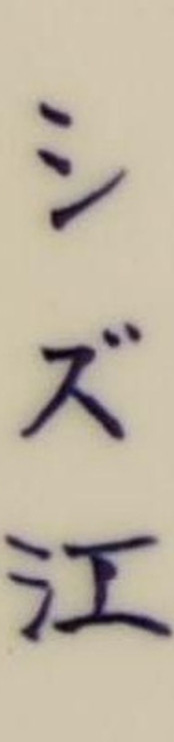シズ江
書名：A~D
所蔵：koyasan kongobuji
